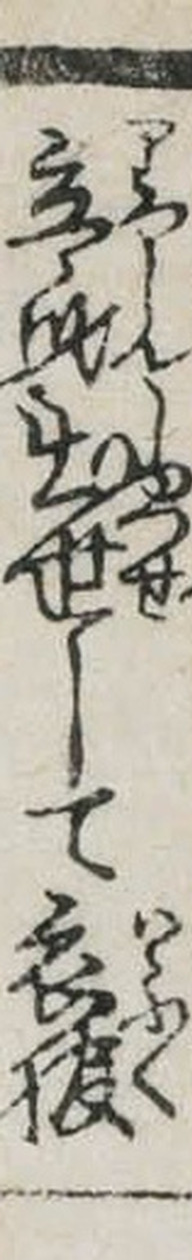立身出世して衣服
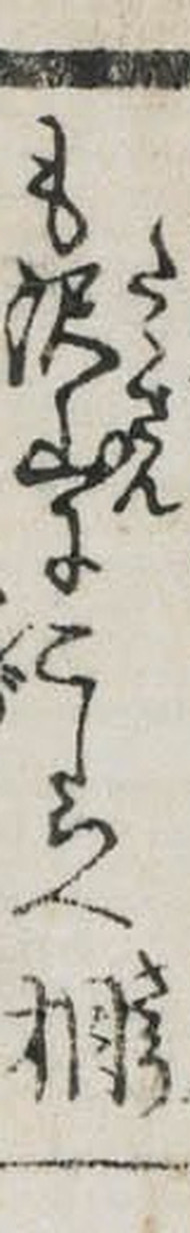も沢山にこしらへ相
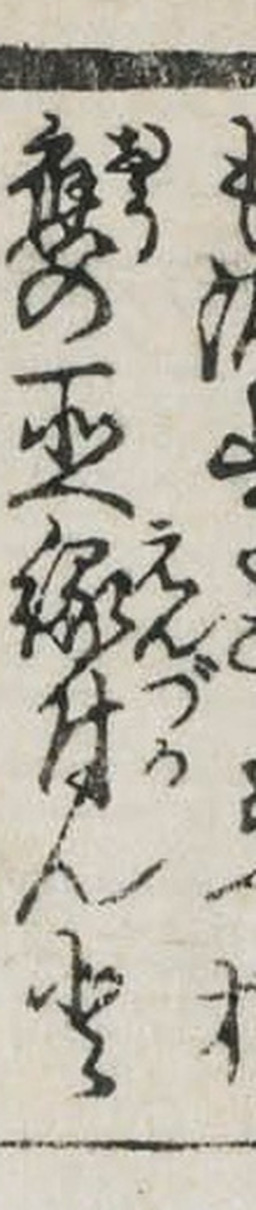応の所へ縁付んと
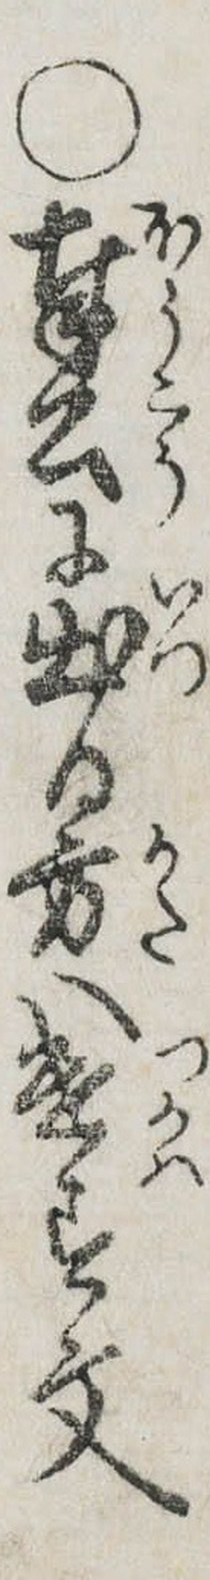○奉公に出る方へ遣す文
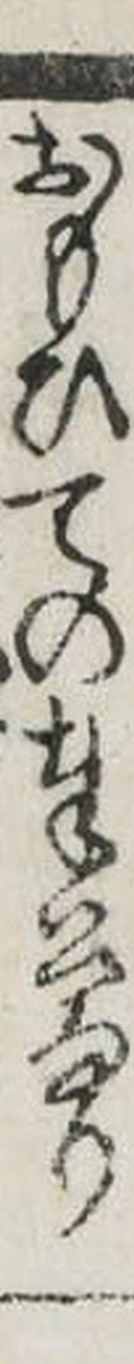おもひての奉公なり
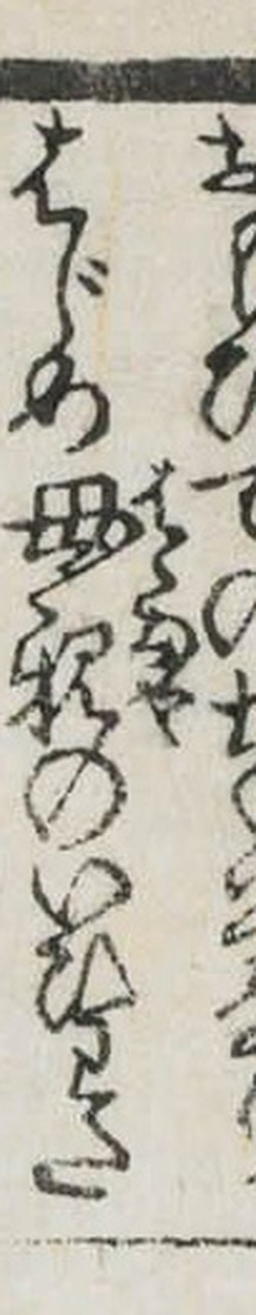はじめ母親のいひわた
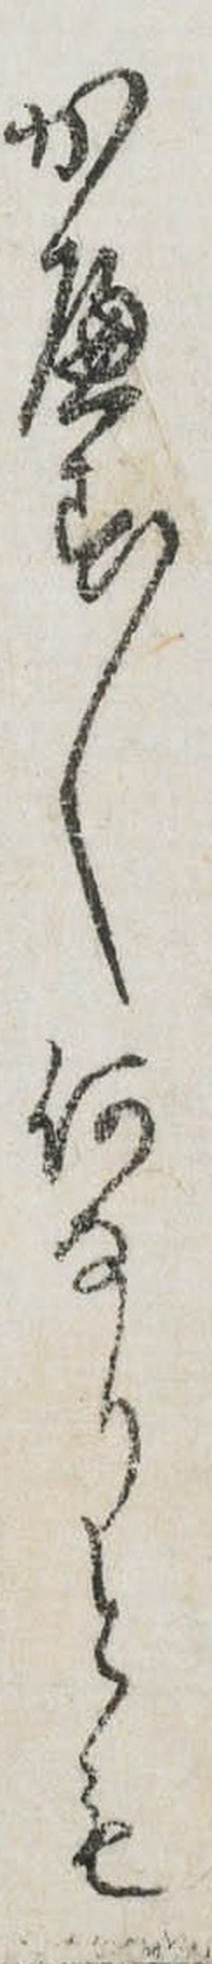かへす〳〵何なりとも
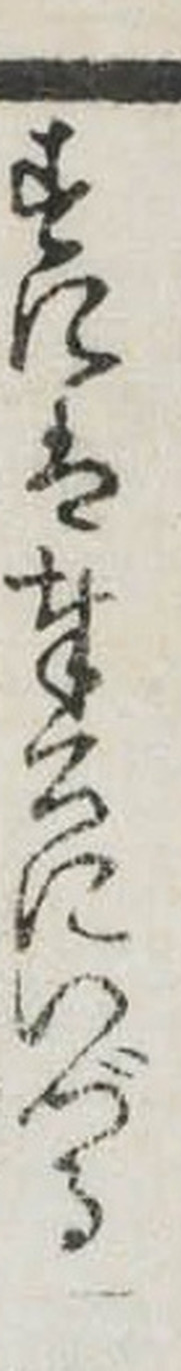すには奉公にいづる
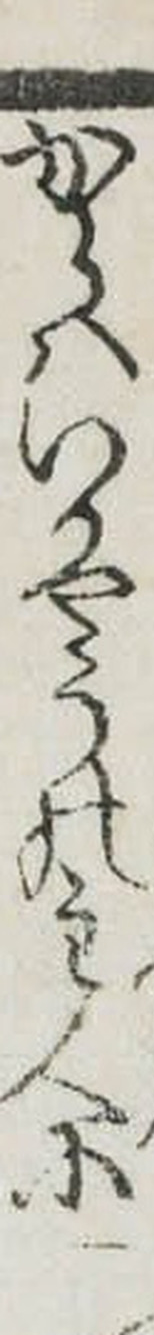からはいかやうの主人に
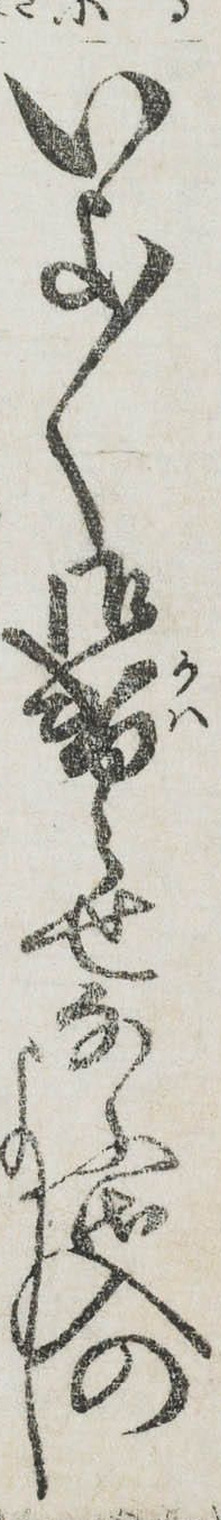いよ〳〵御替らせなふ御入のよし
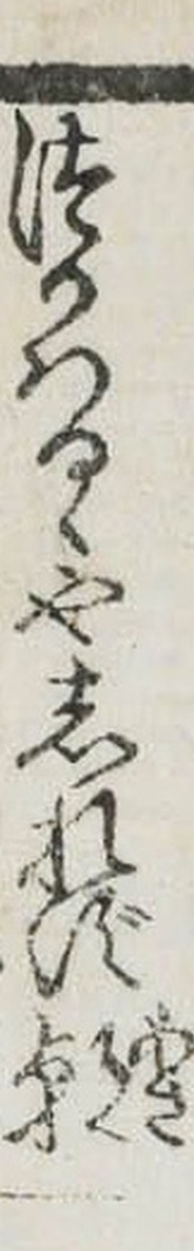つかはるゝやしれず朝
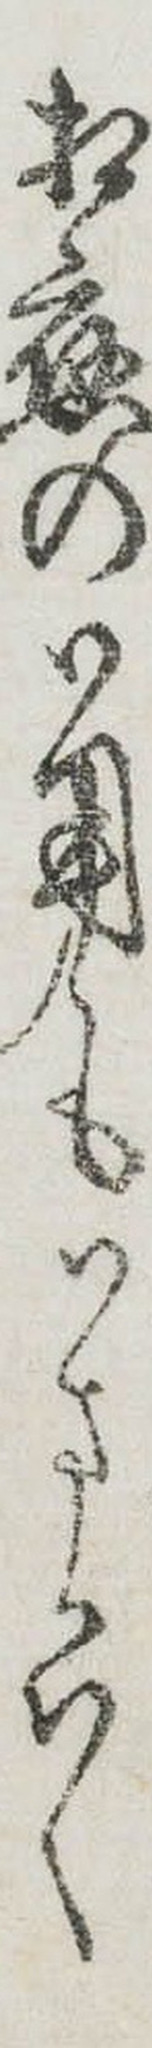相応の御用も御さ候はゝ
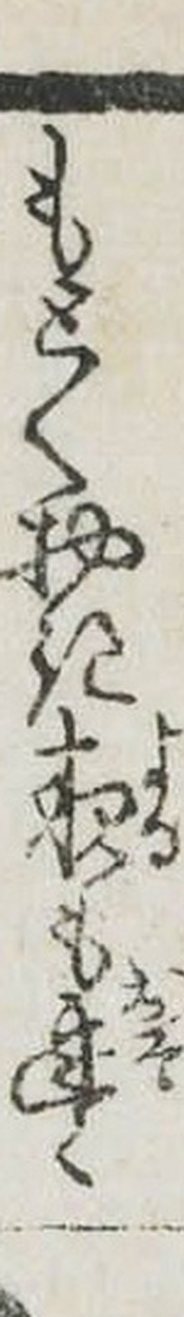もとくおき夜も遅く
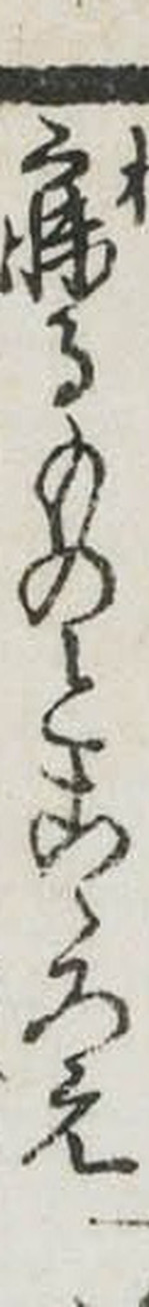寝るものとこゝろえ
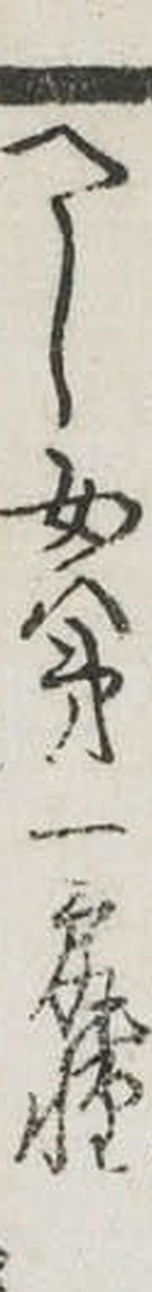へし女は第一尻軽
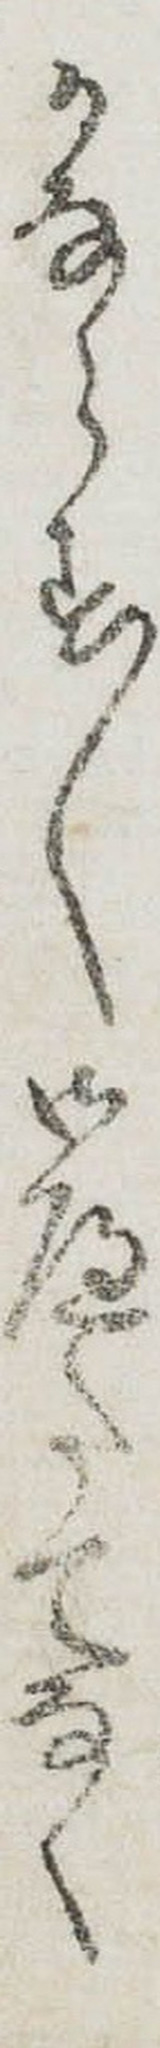かならす〳〵御へたてなく
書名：頭書萬用婦人手紙之文言
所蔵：東京学芸大学教育コンテンツアーカイブ
